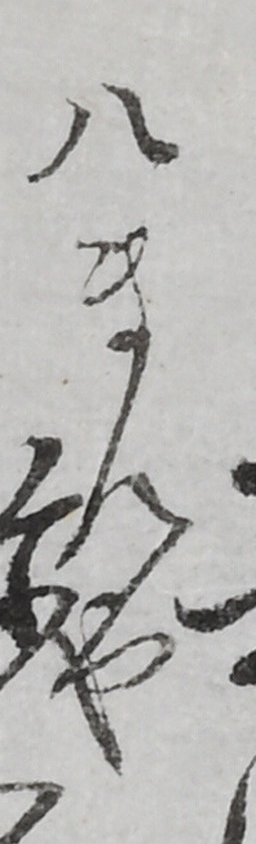八まんや
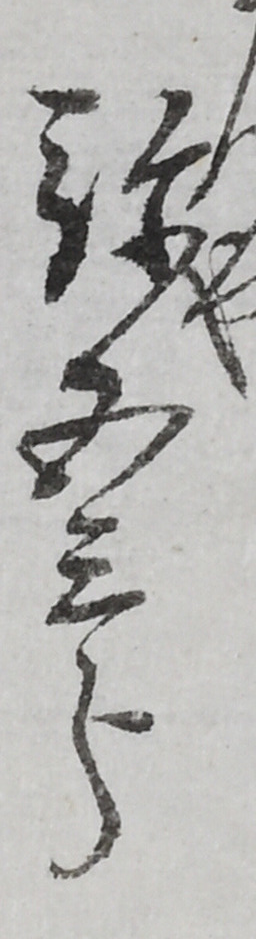弥五三郎
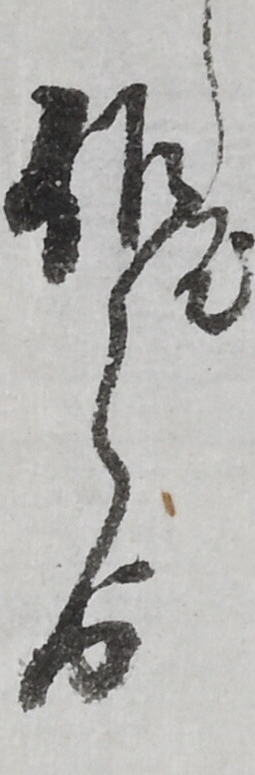作右衛門
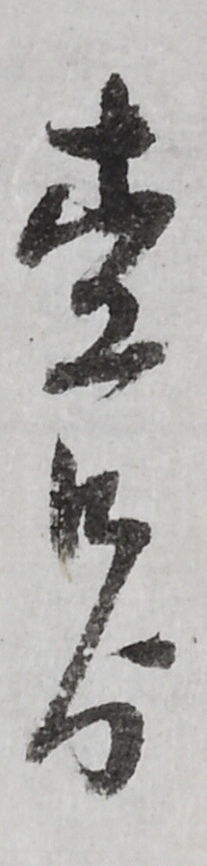作右衛門
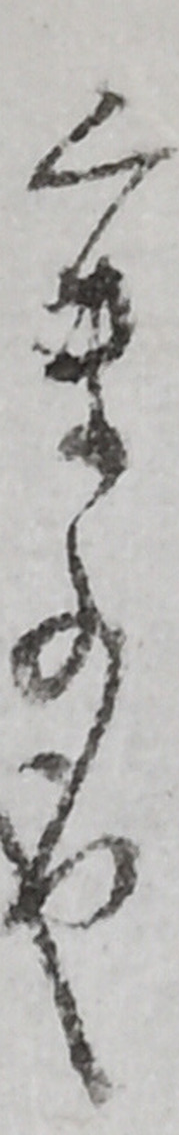くまのや
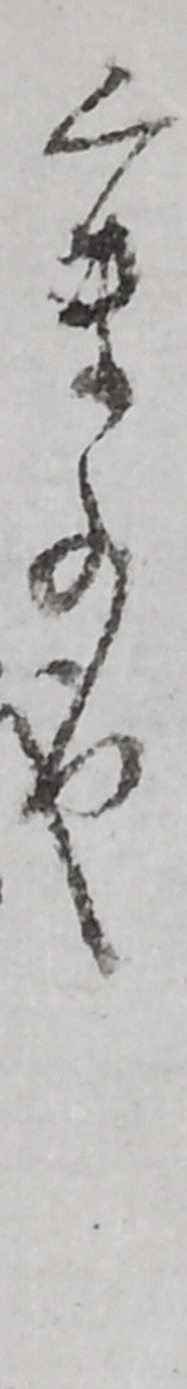くまのや
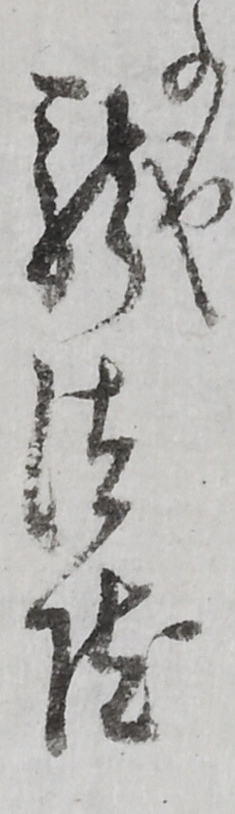新法院
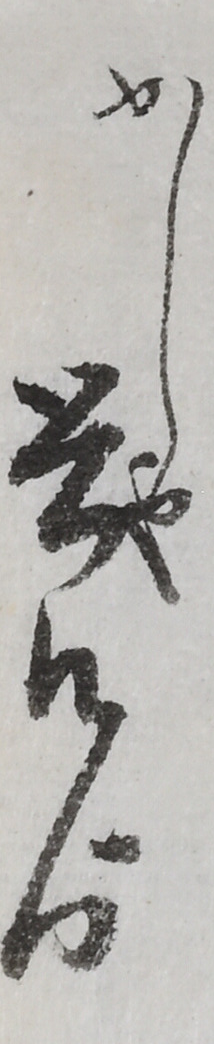杢左衛門
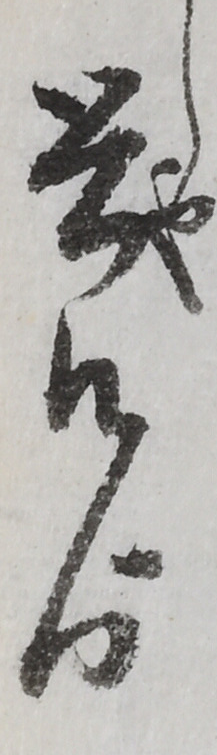杢左衛門
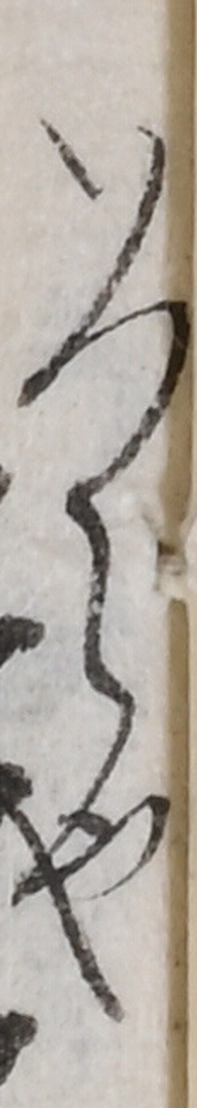いつみや
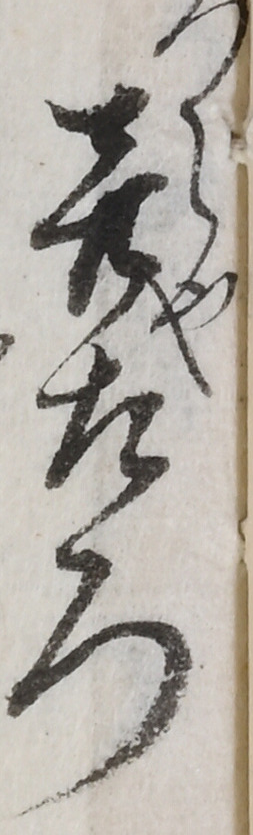喜左衛門
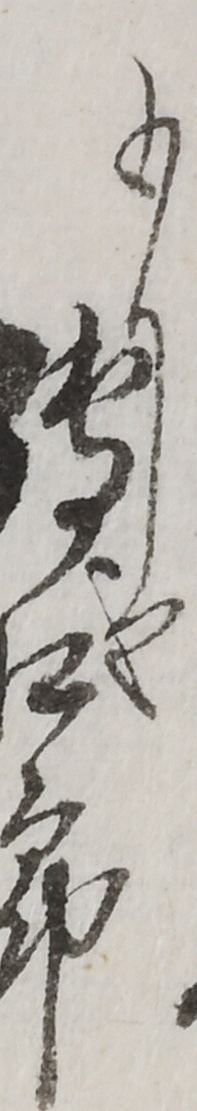傳四郎
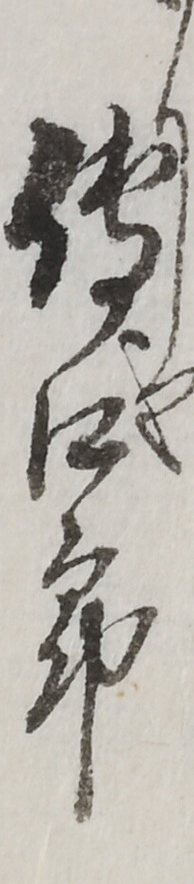傳四郎
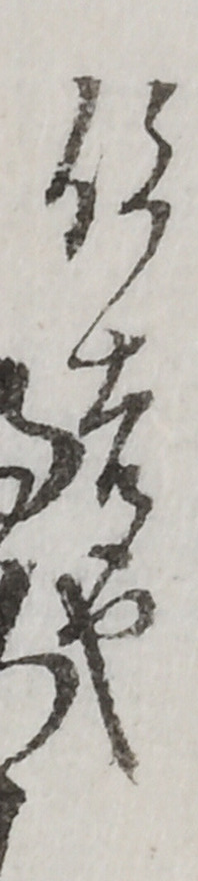住吉や
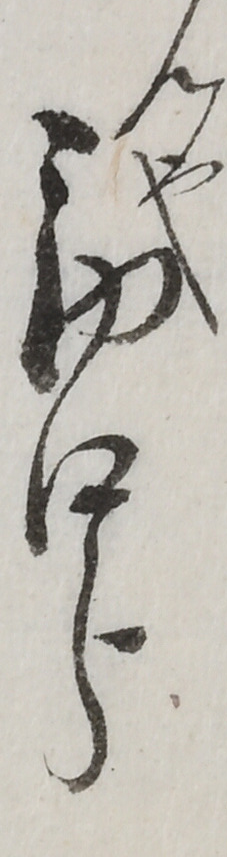傳四郎
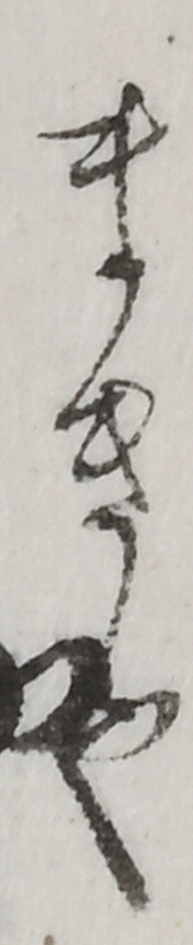まきや
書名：當町火消道具幷役附帳
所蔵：伊那市立高遠町図書館・合同会社AMANE
